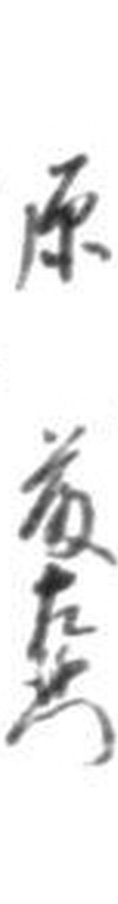原藤左衛門
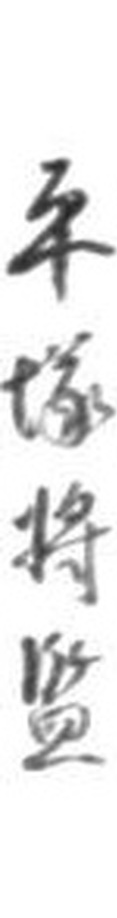平塚将監
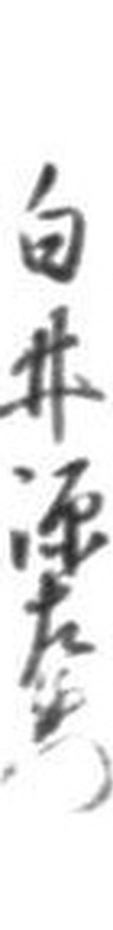白井源左衛門
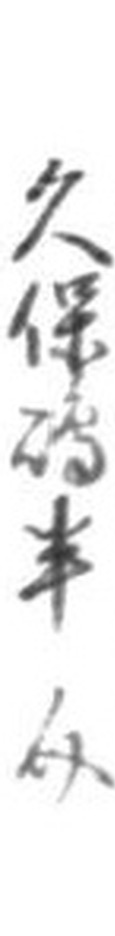久保嶋半介
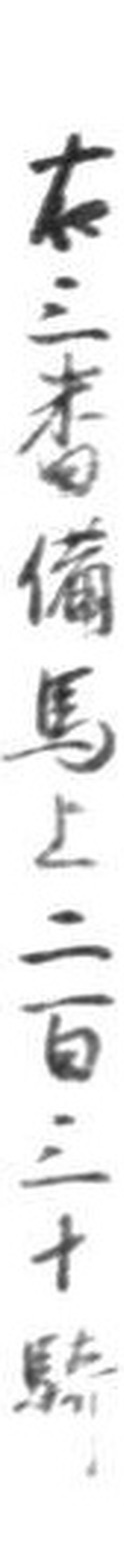右三番備馬上二百三十騎
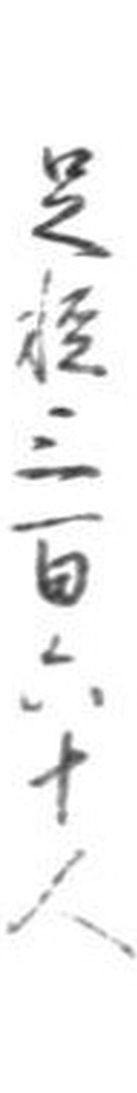足軽三百六十人

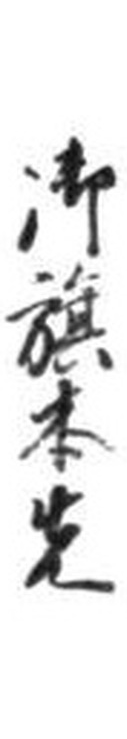御旗本先
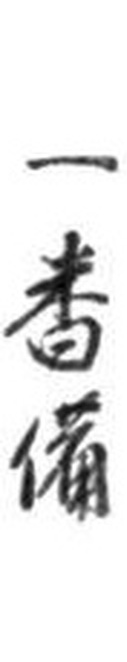一番備
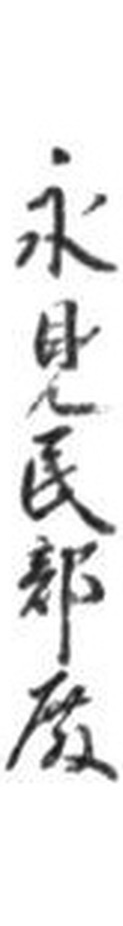永見民部殿
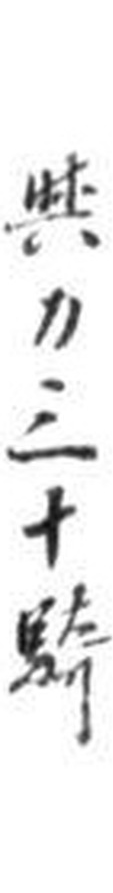与力三十騎
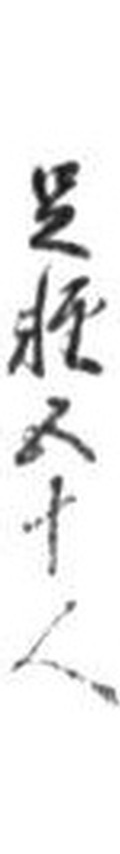足軽五十人
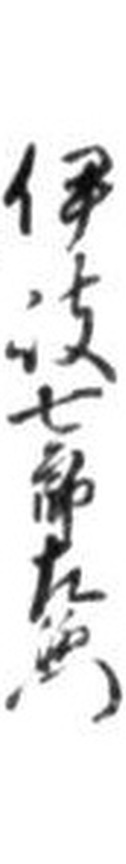伊岐七郎左衛門
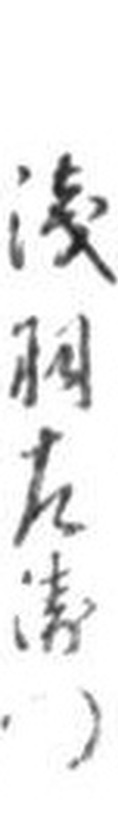浅羽左衛門
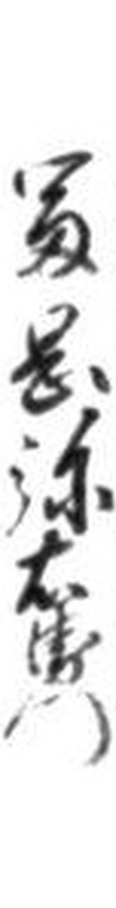富岡弥右衛門
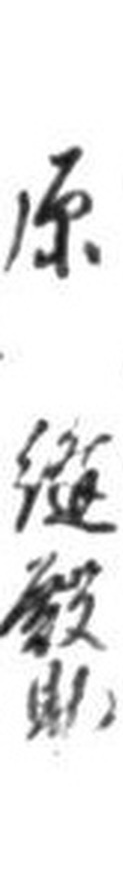原縫殿助
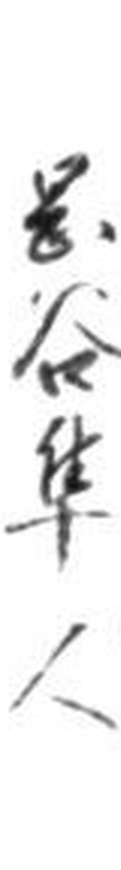岡谷隼人
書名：家譜 二 忠直公 従文禄四年到慶安四年
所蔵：福井県文書館 Fukui Prefectural Archives
